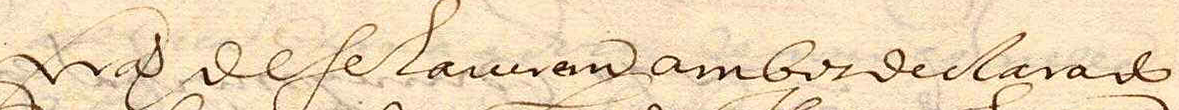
foraõ de se hauerem ambos declarado
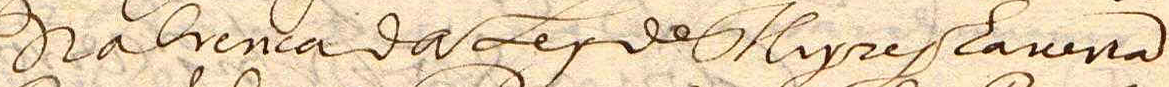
na crença da Ley de Moyzes hauera
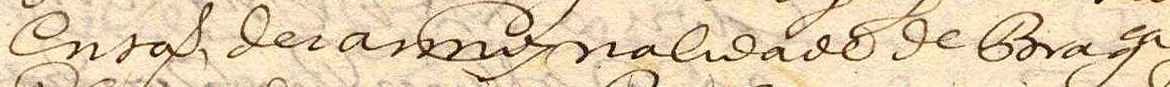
Entaõ, dez annos na cidade de Bragca
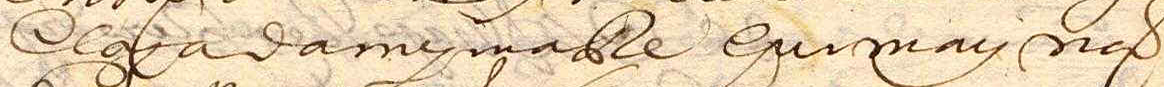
E caza da mesma Re e por mais naõ
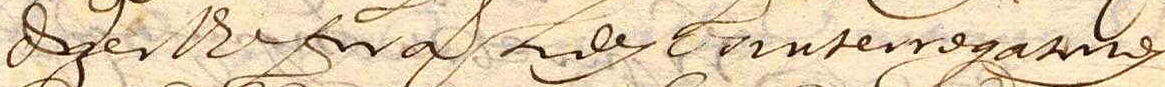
dizer lhe foraõ lidos os interrogatorios
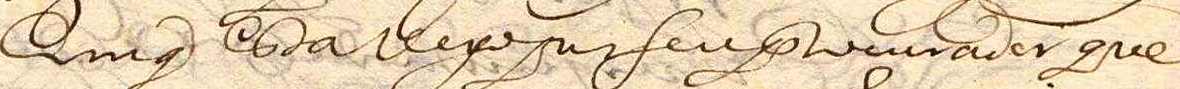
Em q̄ esta veyo por seu pRocurador que
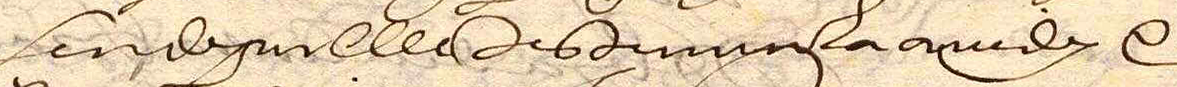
sendo por elle testemunha ouuidos E
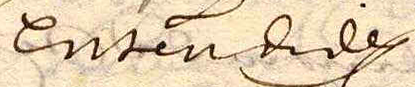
entendidos
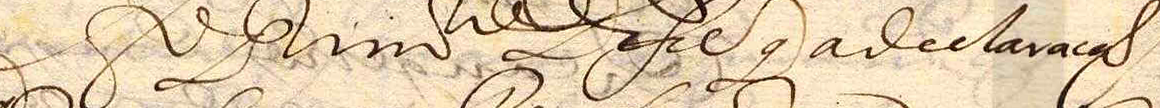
Ao prim.ro Disse q̄ a declaraçaõ
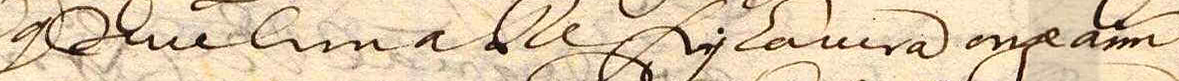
q̄ teue com a Re foy hauera onze ann̄
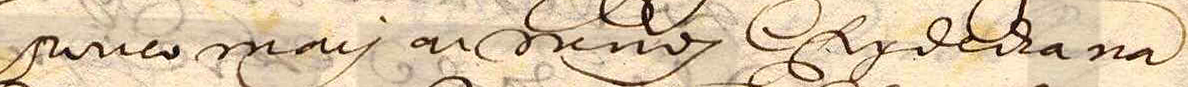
pouco mais ou menos E foy de dia na
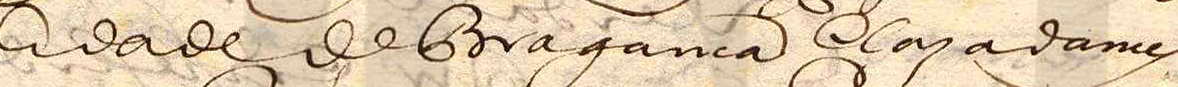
Cidade de Bragança E Caza da mes
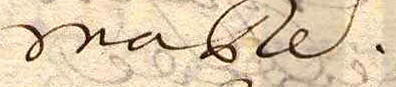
na Re.
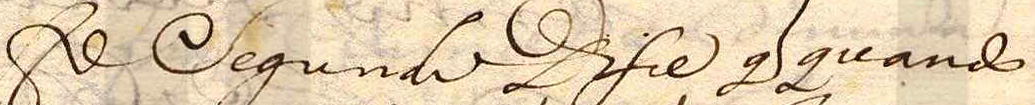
Ao Segundo Disse q̄ quando
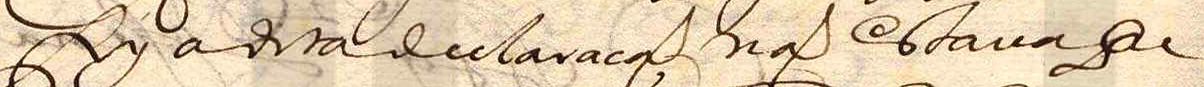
foy a dita declaraçaõ naõ estaua pre
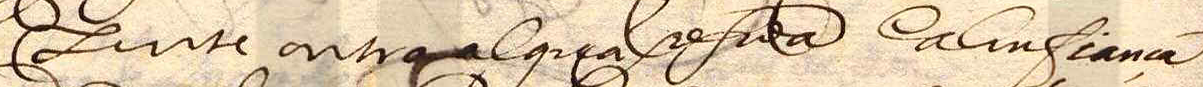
zente outra alguā pessoa E a Confiança
